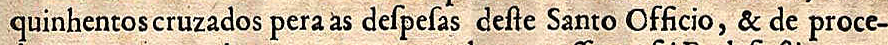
quinhentos cruzados pera as despesas deste Santo Officio, & de proce
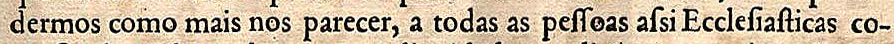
dermos como mais nos parecer, a todas as pessoas assi Ecclesiasticas co
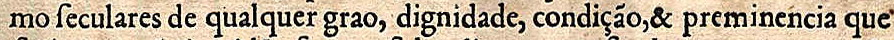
mo seculares de qualquer grao, dignidade, condição, & preminencia que
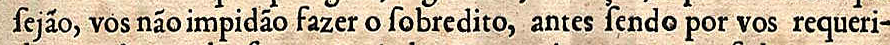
sejão, vos não impidão fazer o sobredito, antes sendo por vos requeri
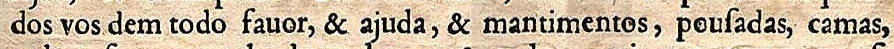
dos vos dem todo fauor, & ajuda, & mantimentos, pousadas, camas,
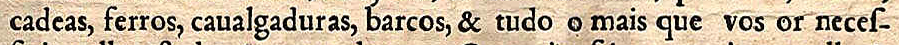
cadeas, ferros, caualgaduras, barcos, & tudo o mais que vos or neces
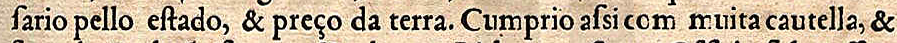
sario pello estado, & preço da terra. Cumprio assi com muita cautella, &
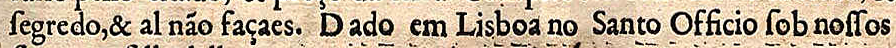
segredo, & al não façaes. Dado em Lisboa no Santo Officio sob nossos
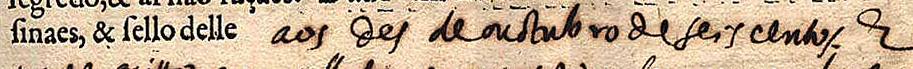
sinaes, & sello delle aos des de ouctubro de seiscentos. E
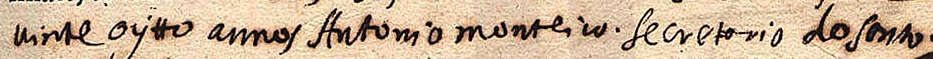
uinte oytto annos Antonio monteiro. secretario do santo
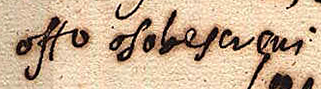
offo o sobescreui
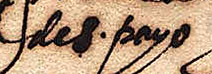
de s. payo
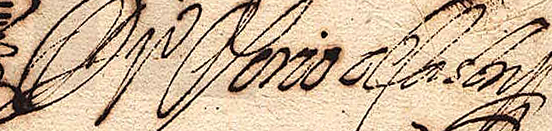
Dio Osorio de Castro
